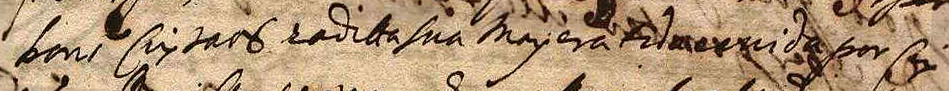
bons Cristaõs e a ditta sua may era tida e auida por Cris
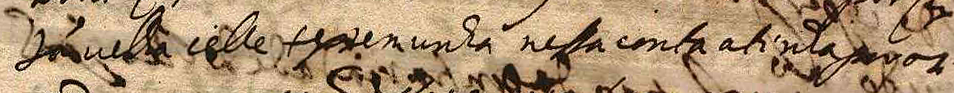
tā uelha e elle testemunha nessa conta a tinha per asi
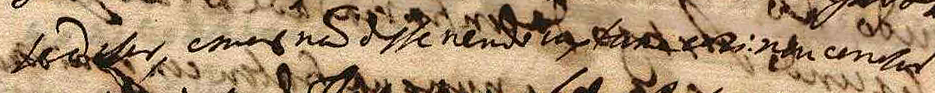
se diser, e mais naõ disse nen do custume e asinou con o sor
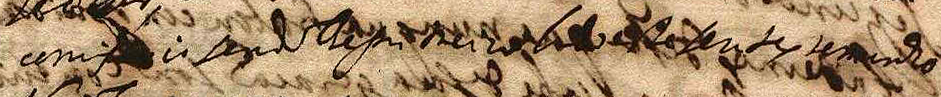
comisario sendolhe primeiro lido este seu testemunho
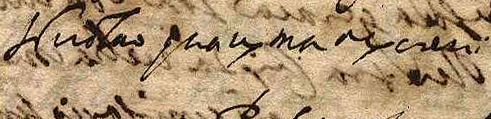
Nicolao quaresma o escreui
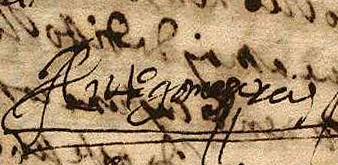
Anto gomes reis
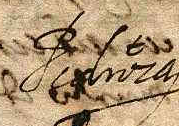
Pedroza
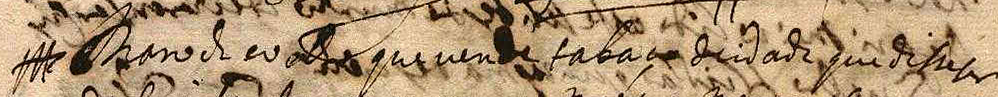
item Manoel coelho que uende tabaco de idade que disse ser
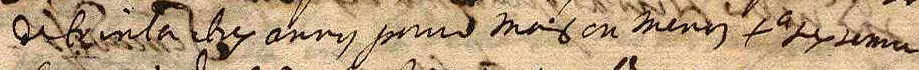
de trinta e tres annos pouco mais ou menos ta testemu
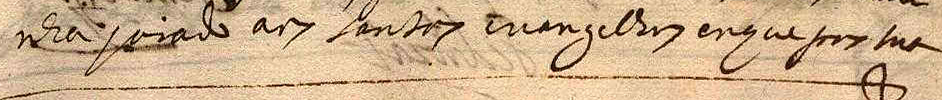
nha jurado aos santos euangelhos en que pos sua
